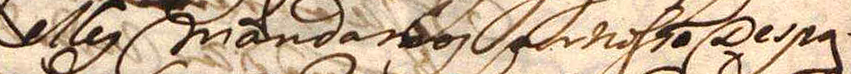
elles mandamos per nosso Despa
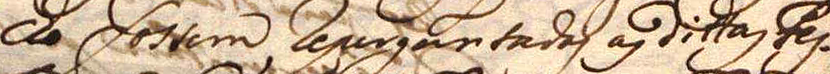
cho fossem Reperguntadas as dittas Tes
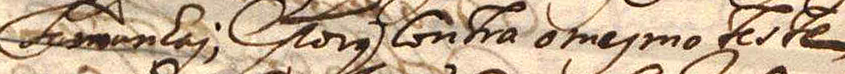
temunhas; & porq̄ Contra o mesmo Teste
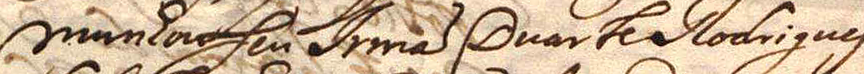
munhou seu Irmaõ Duarte Rodrigues
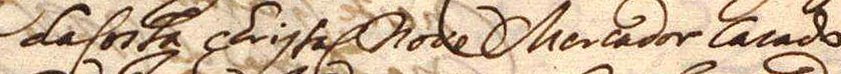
da Costa christā novo Mercador cazado
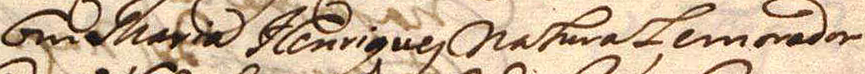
com Maria Henriques natural, e morador
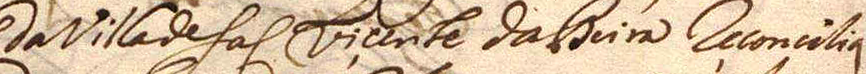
da Villa de Sā Viçente da Beira Reconcilia
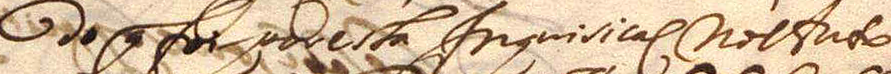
do q̄ foi por esta Jnquisiçā no Auto
